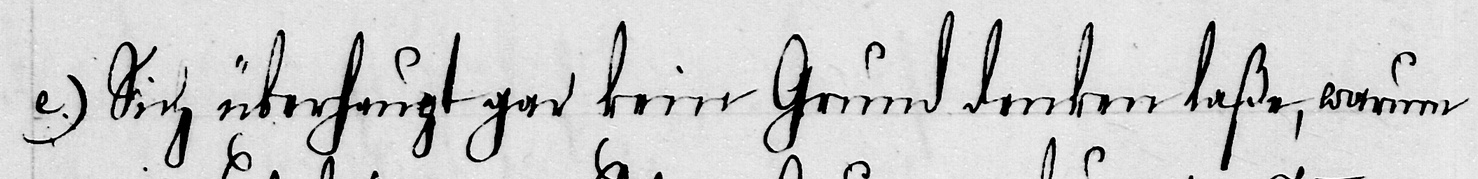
e.) Sich überhaupt gar kein Grund denken laße, warum
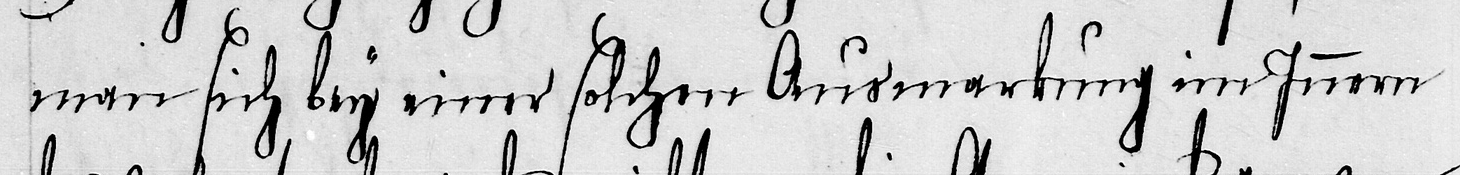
man sich bey einer solchen Ausmarkung im Innern
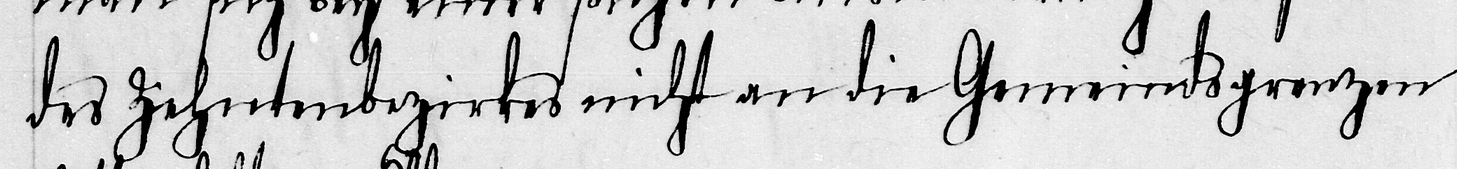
des Zehntenbezirkes nicht an die Gemeindsgrenzen
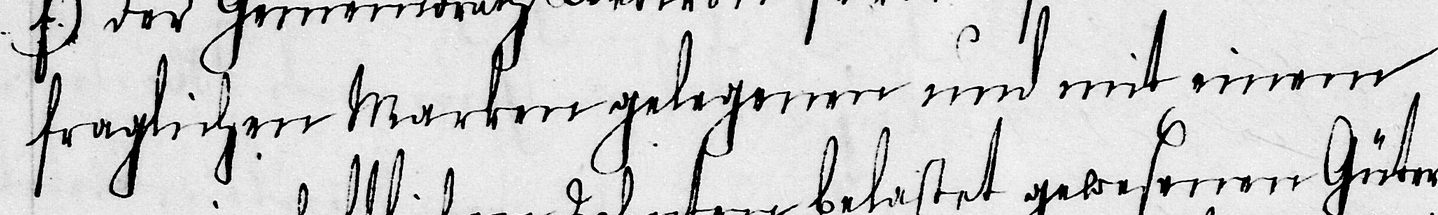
fraglichen Marken gelegenen und mit einem
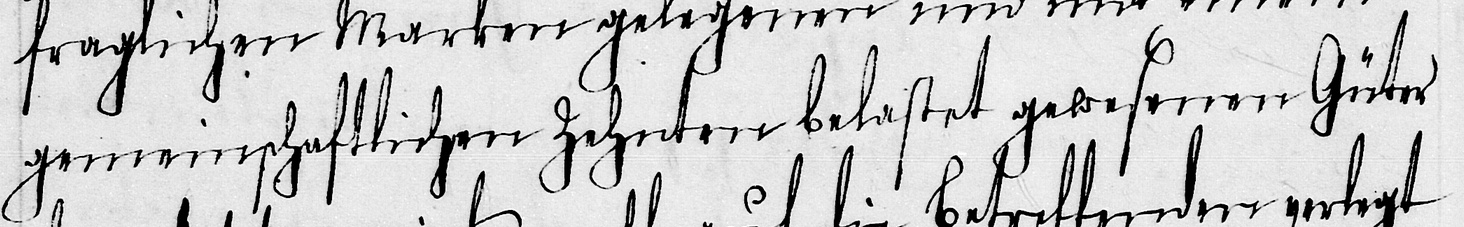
gemeinschaftlichen Zehnten belastet gewesenen Güter
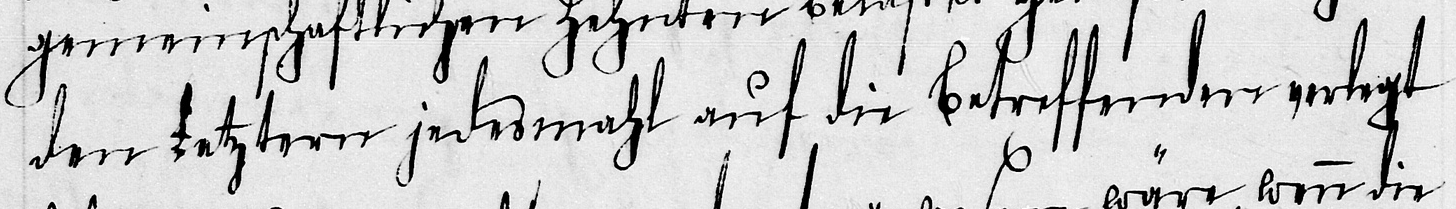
den Letztern jedesmahl auf die Betreffenden verlegt
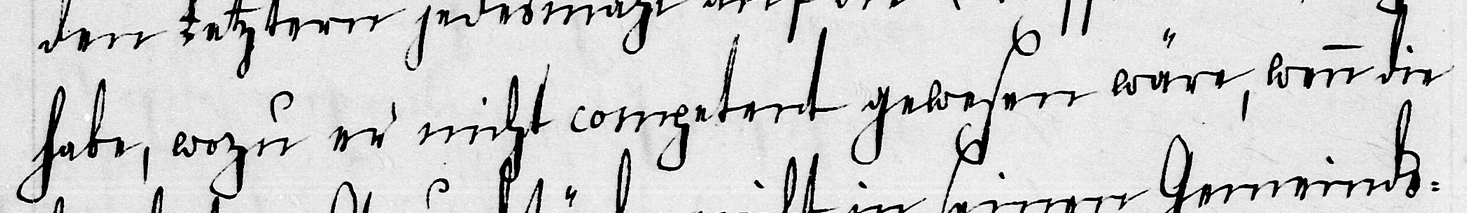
habe, wozu er nicht competent gewesen wäre, wenn die
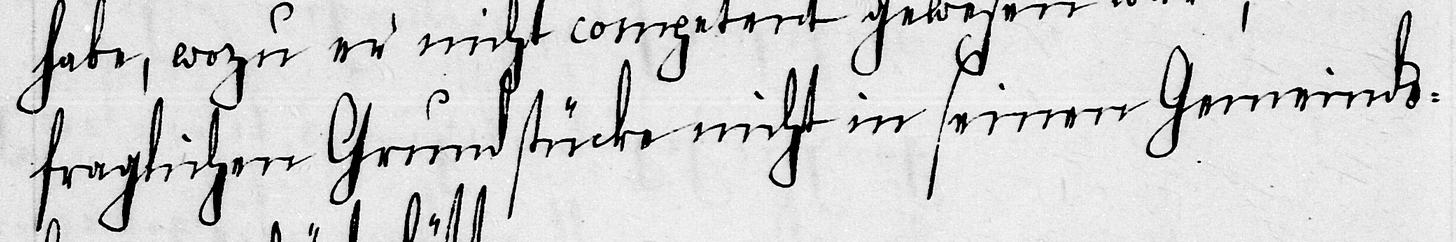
fraglichen Gründstücke nicht in seinen Gemeinds¬
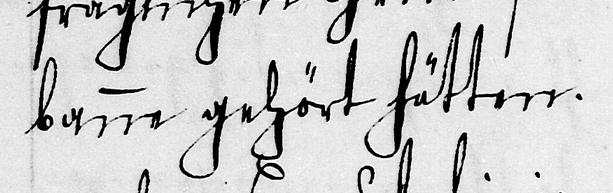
banne gehört hätten.
